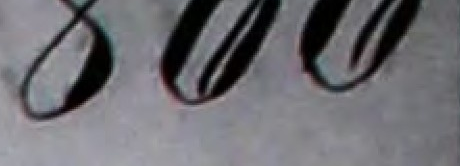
866
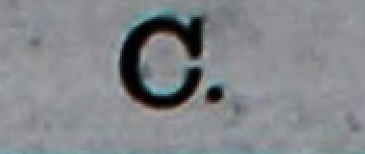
C.
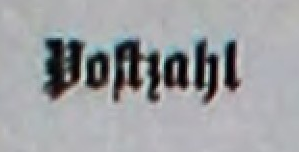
Postzahl
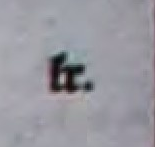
tr.
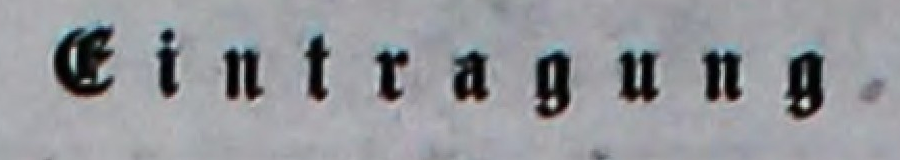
Eintragung
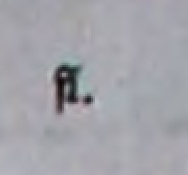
fl.
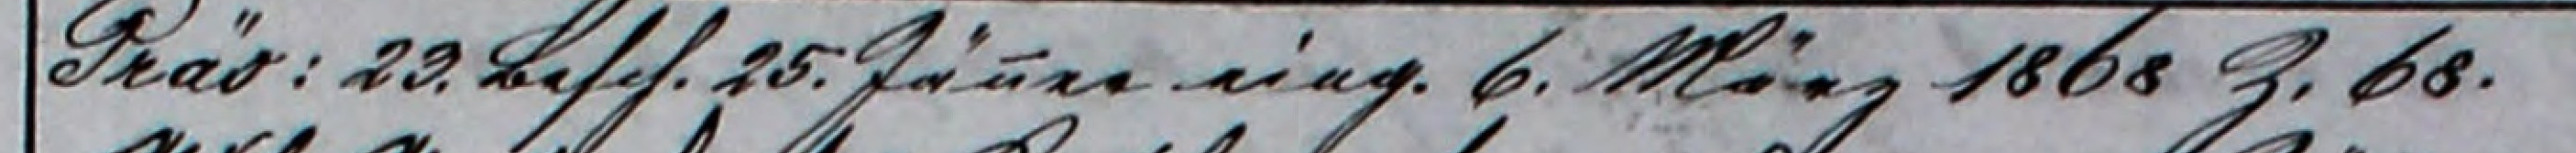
Präs: 23. Besch. 25. Jänner eing. 6. März 1868 Z. 68.
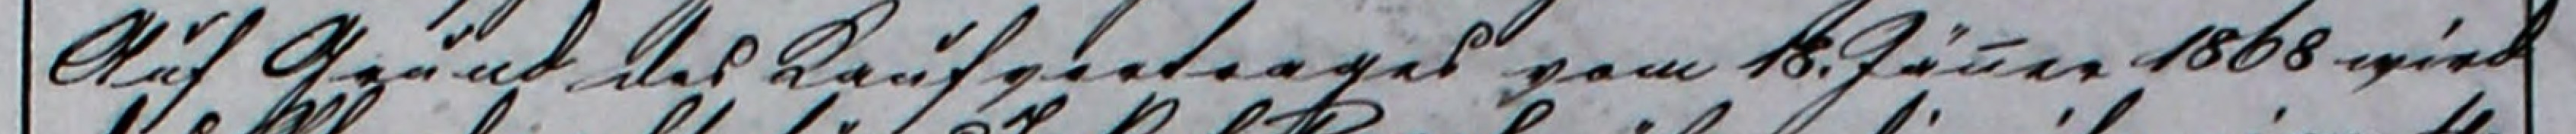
Auf Grund des Kaufvertrages vom 18. Jänner 1868 wird
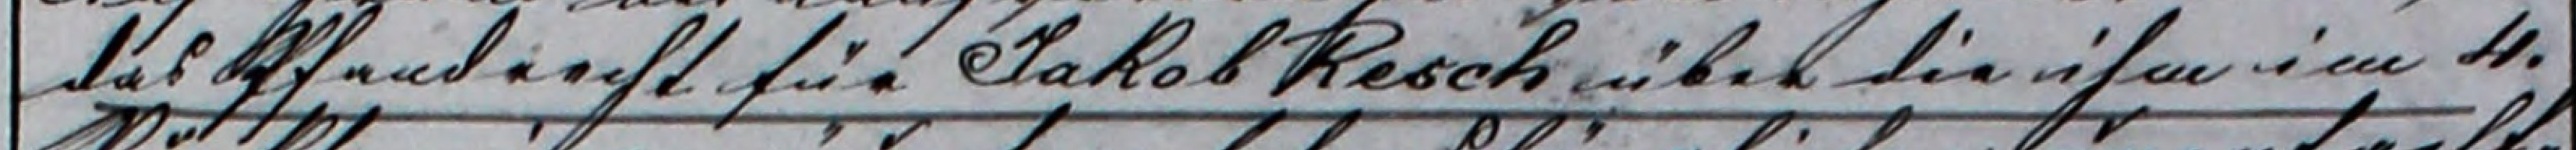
das Pfandrecht für Jakob Resch über die ihm im 4.
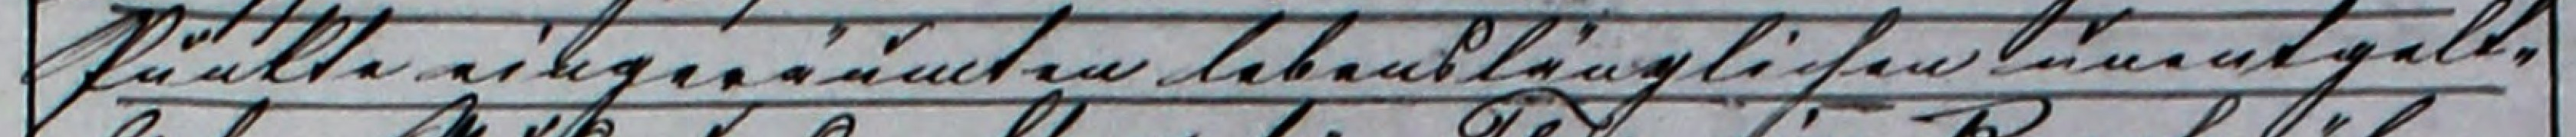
Punkte eingeräumten lebenslänglichen unentgelt„
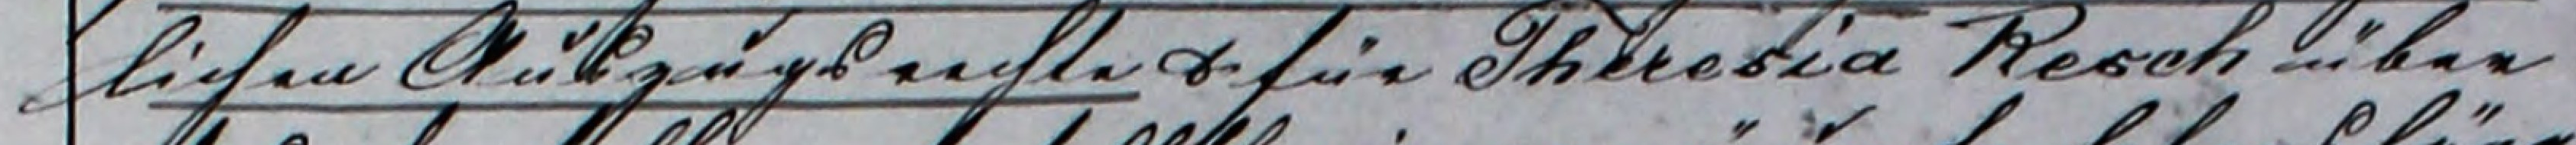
lichen Auszugsrechte & für Theresia Resch über
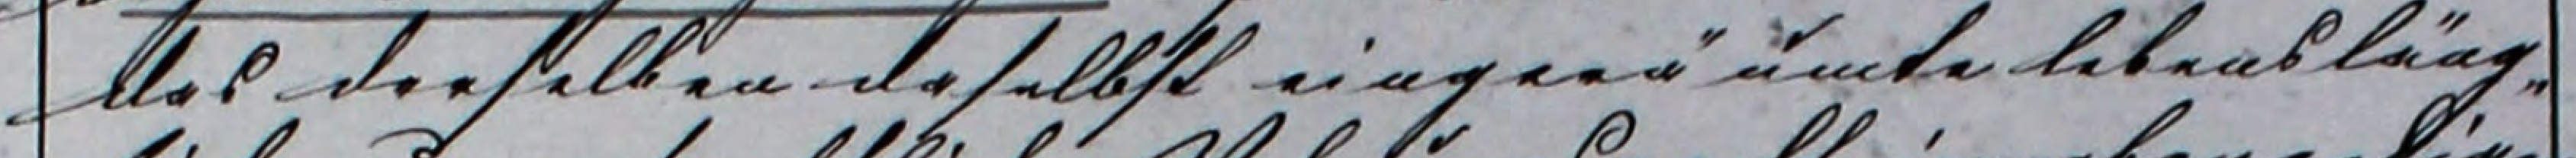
das derselben daselbst eingeräumte lebensläng„
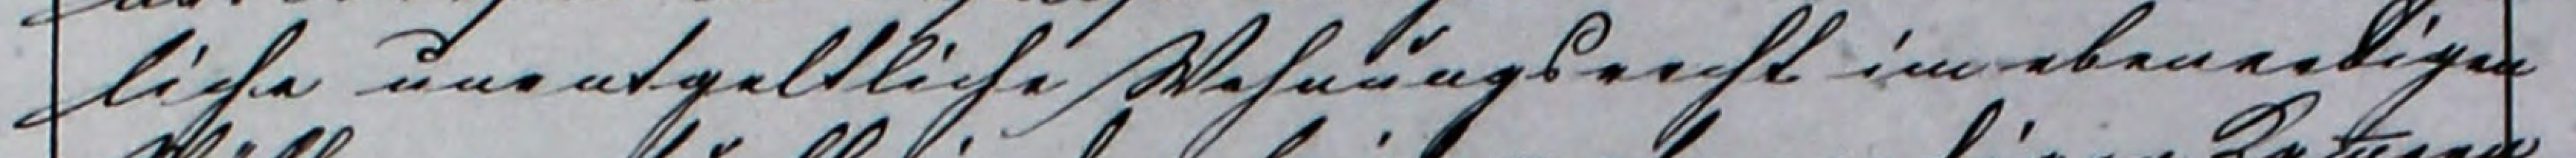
liche unentgeltliche Wohnungsrecht im ebenerdigen
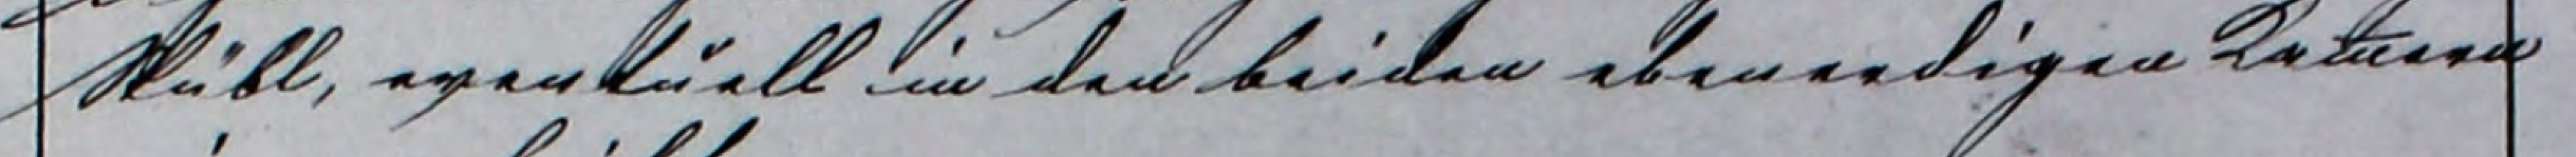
Stübl, eventuell in den beiden ebenerdigen Kammern
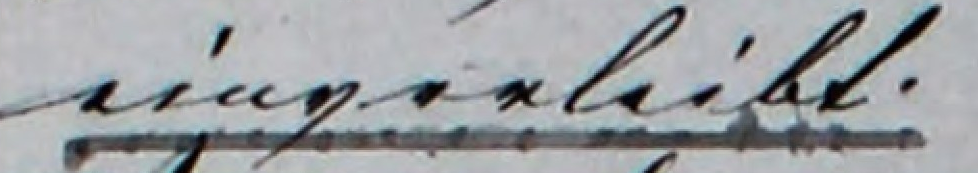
einverleibt.
